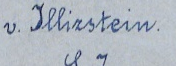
v. Illizstein.
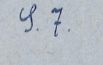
S. 7.
